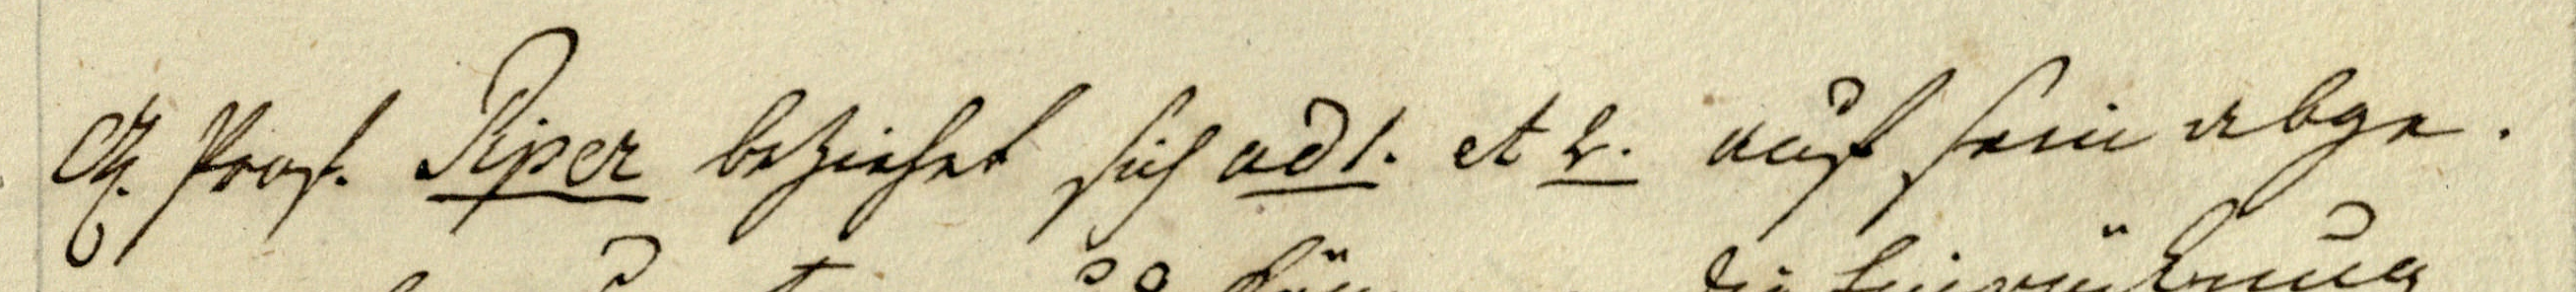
dh. Prof. Piper beziehet sich ad 1. et 2. auf sein abge¬
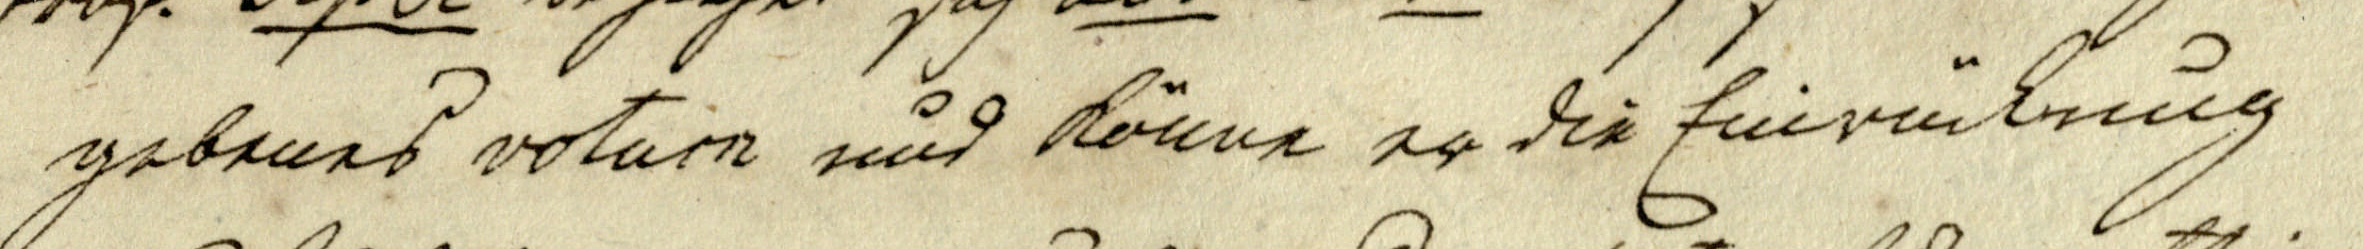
gebenes votum und könne er die Einrückung
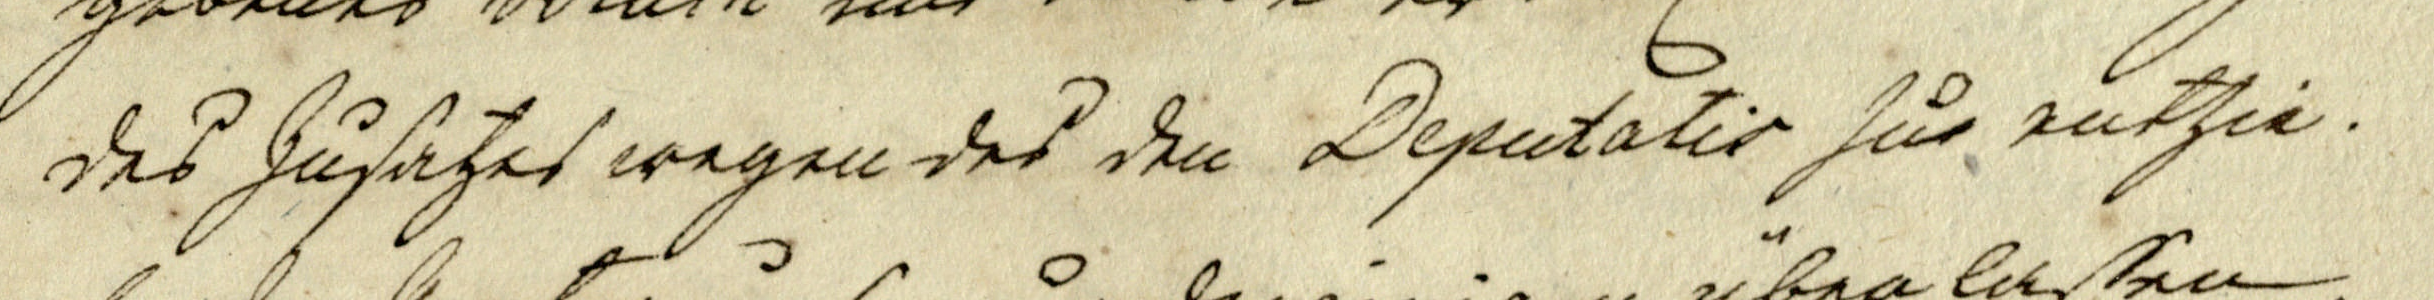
des Zusatzes wegen des den Deputatis zu entzie¬
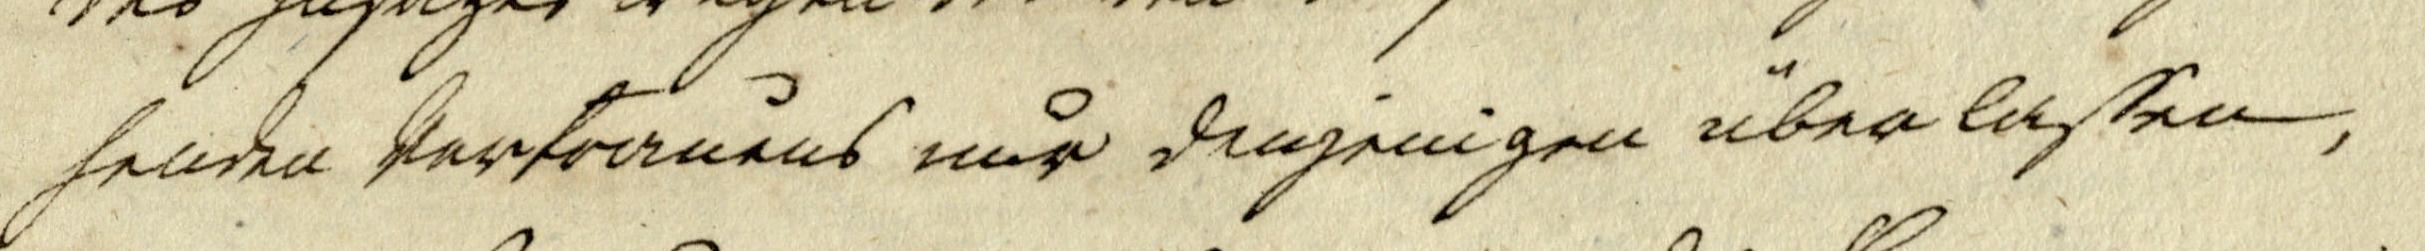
henden Vertrauens nur denjenigen überlassen,
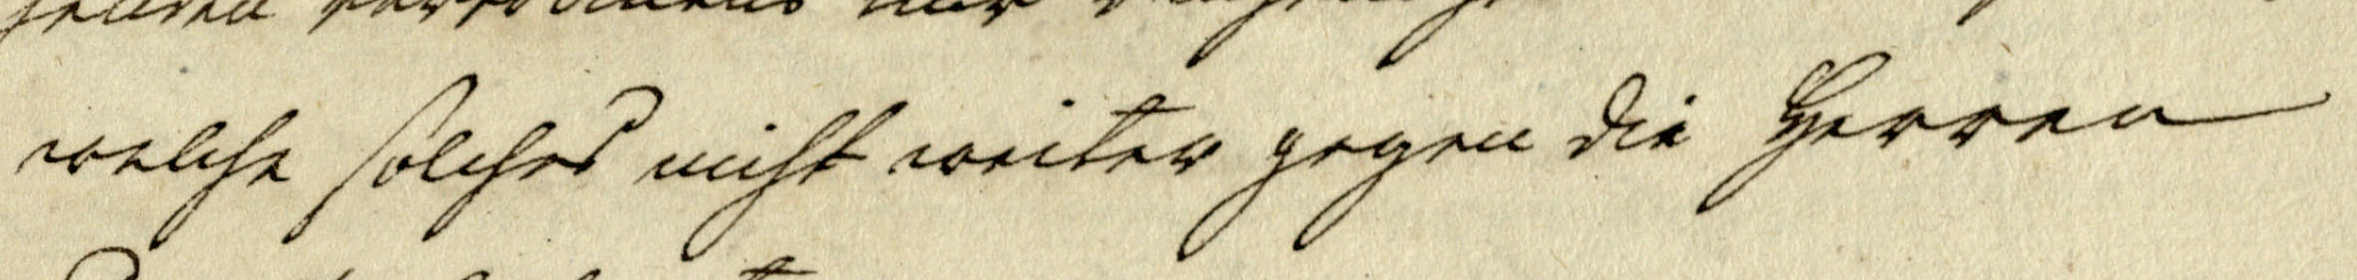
welche solches nicht weiter gegen die Herren
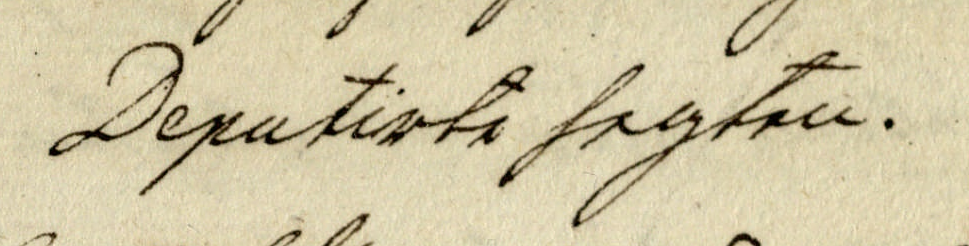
Deputirte hegten.
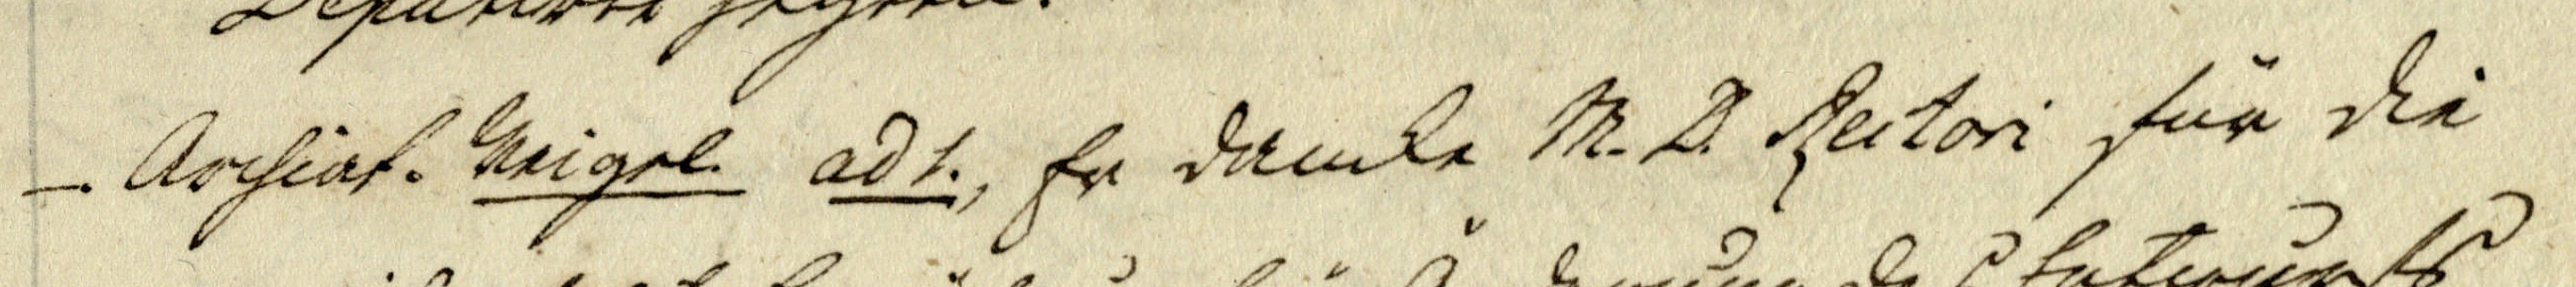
Archiat. Weigel ad 1., Er dancke M. D. Rectori für die
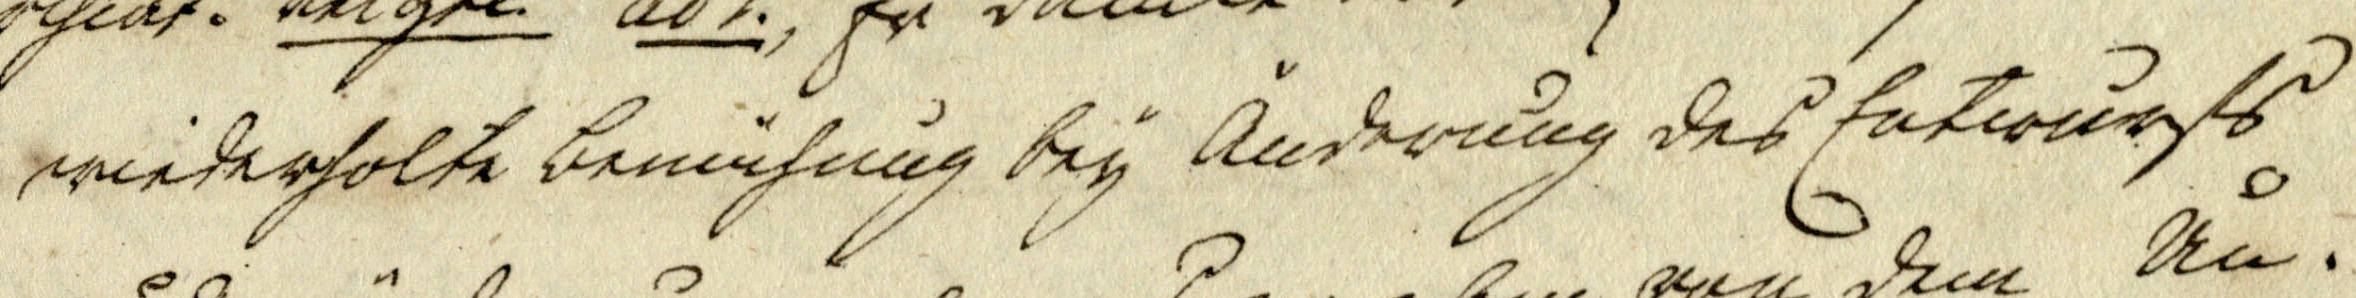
wiederholte Bemühung beÿ Änderung des Entwurfs
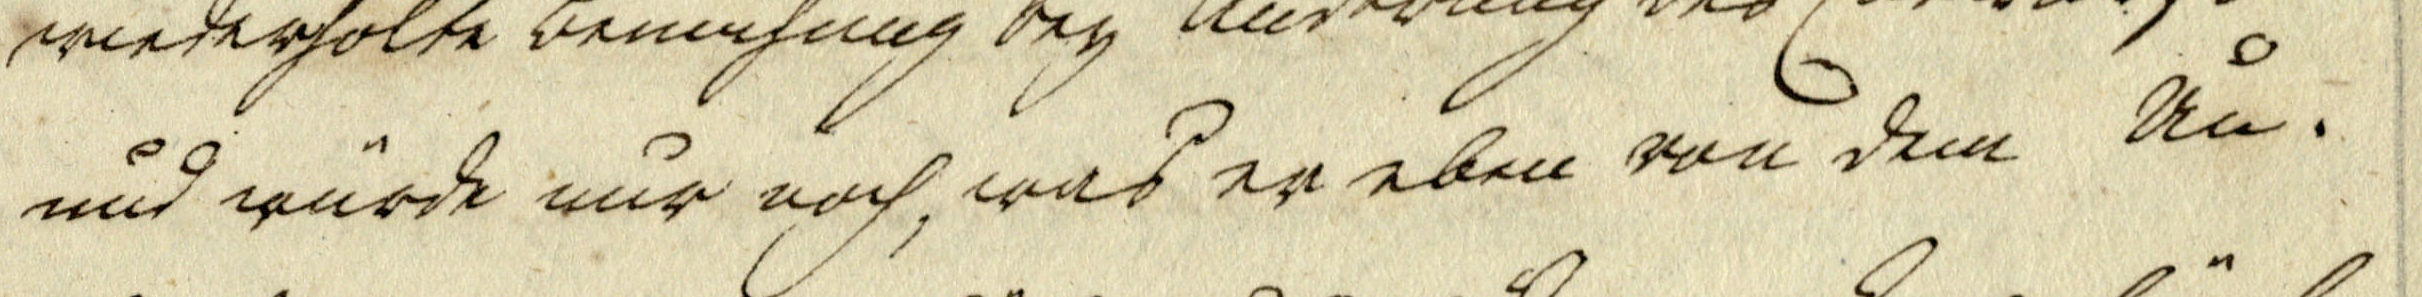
und würde nur noch, was er eben von dem Un¬
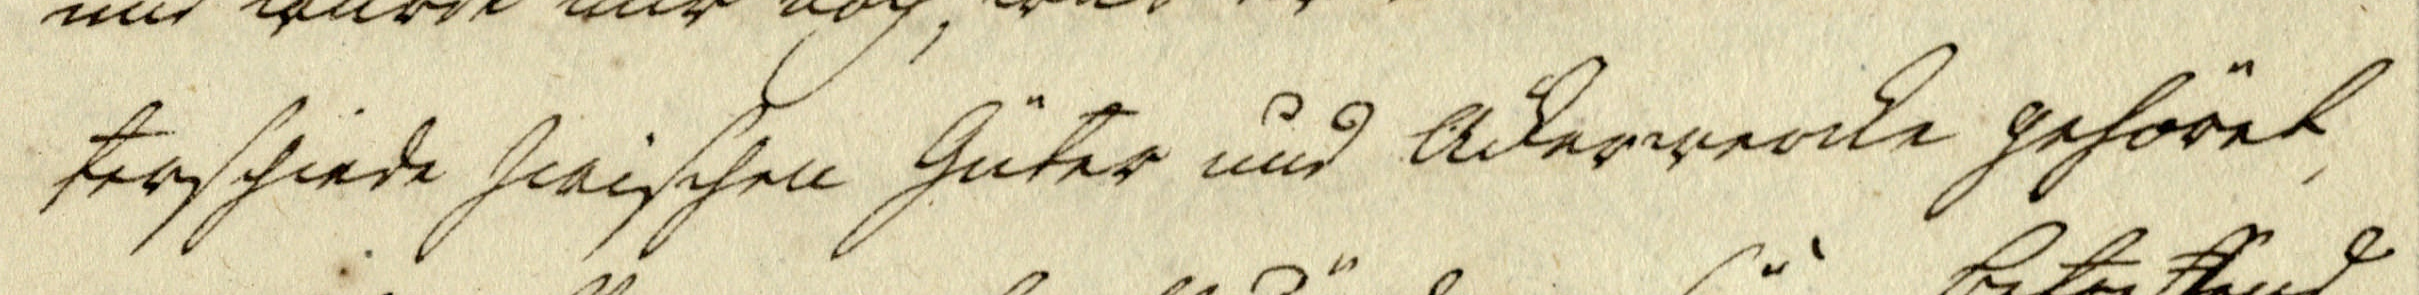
terschiede zwischen Güter und Ackerwercke gehöret,
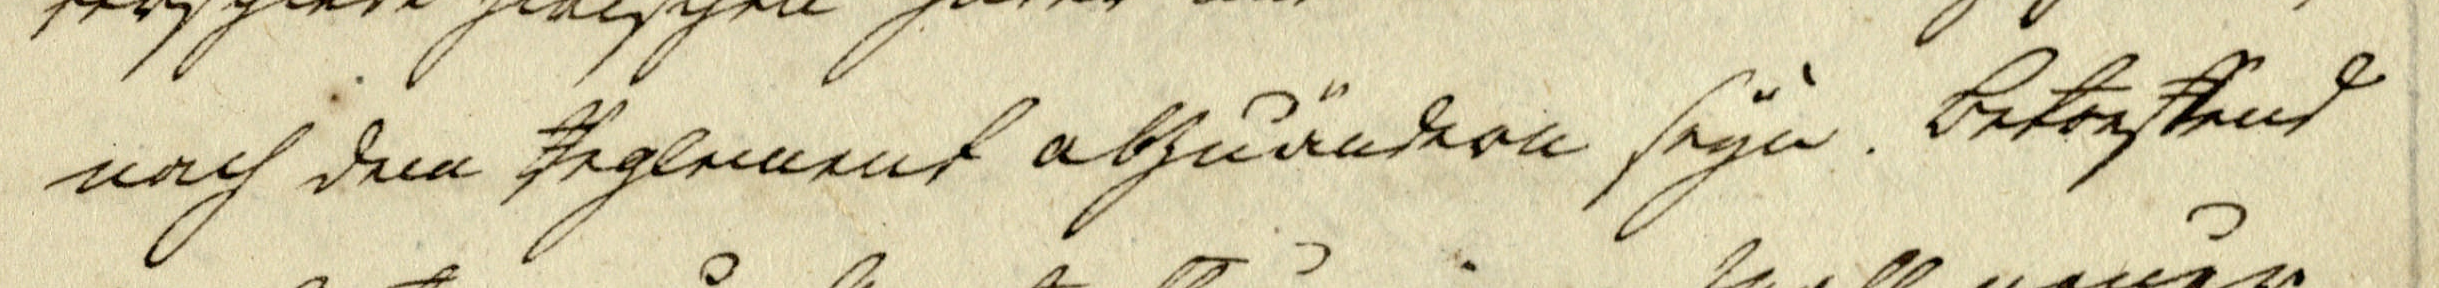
nach dem Reglement abzuändern seÿn betreffend
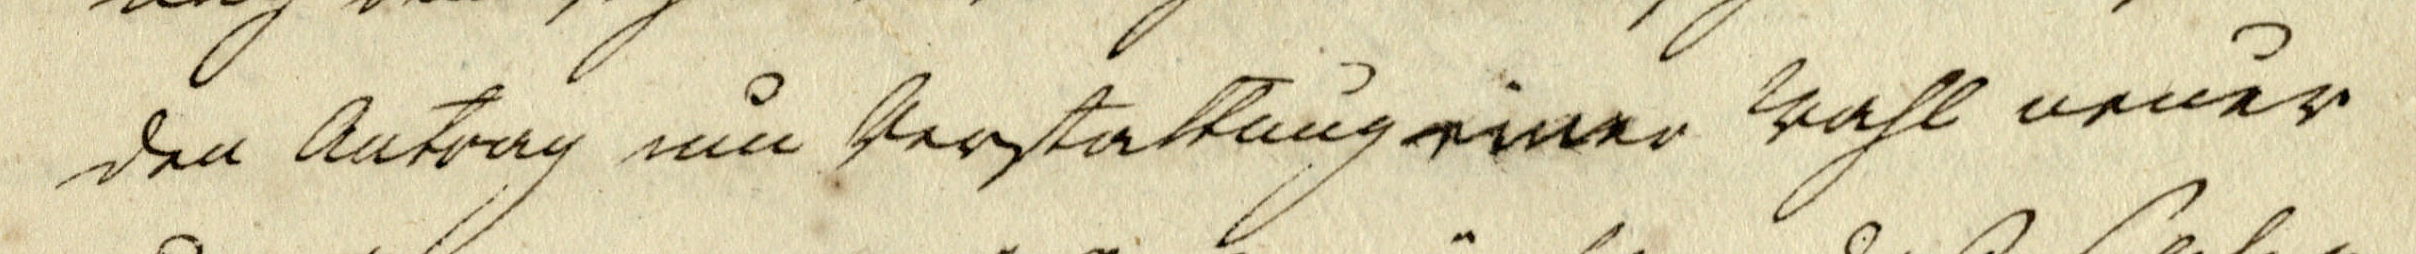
den Antrag um Verstattung einer Wahl neuer
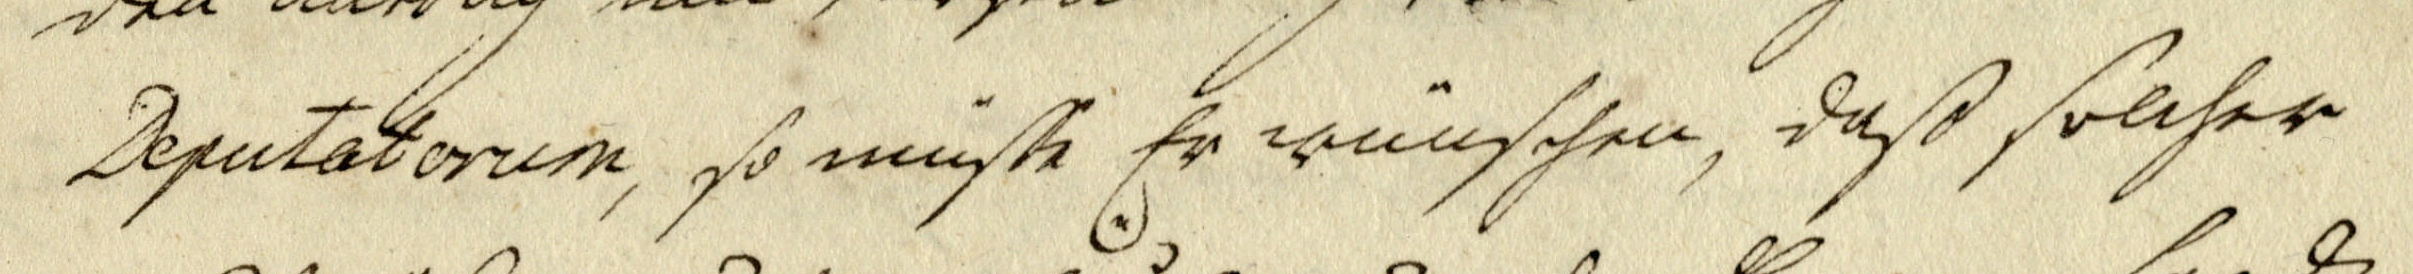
Deputatorum, so müsse Er wünschen, daß solcher
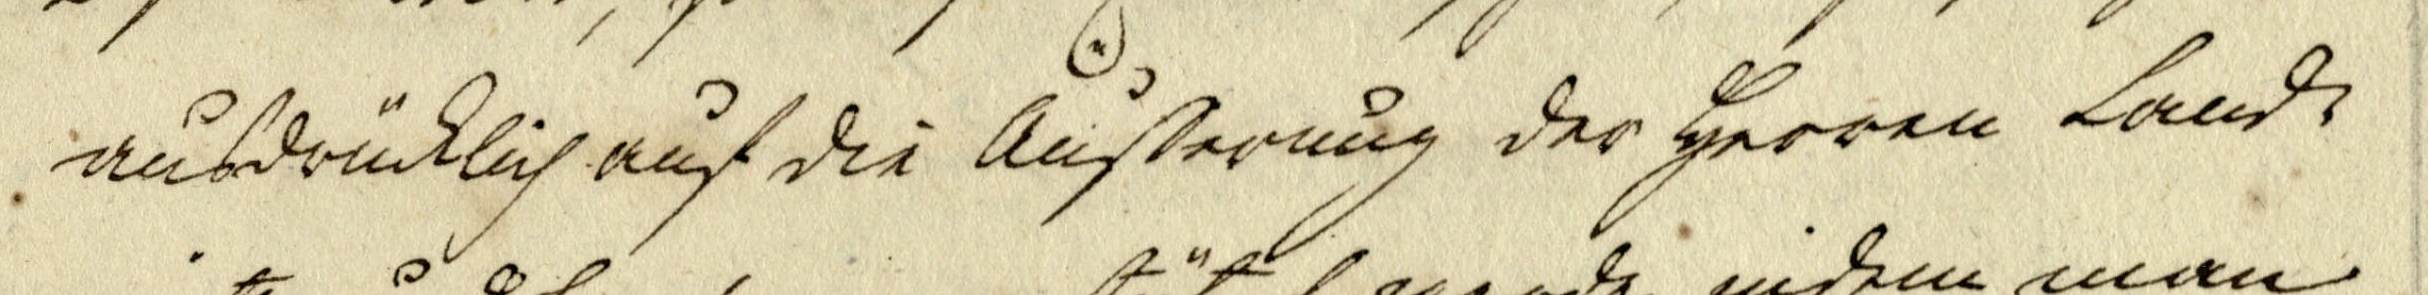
ausdrücklich auf die Äusserung der Herren Land¬
